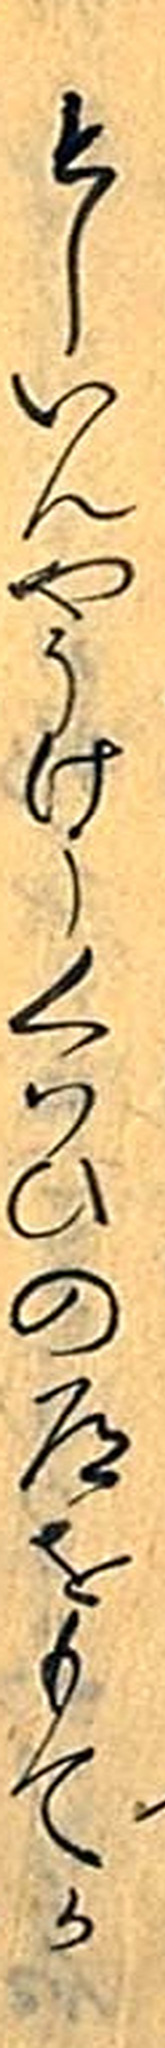もしいんやうけうくはひの道をもてか
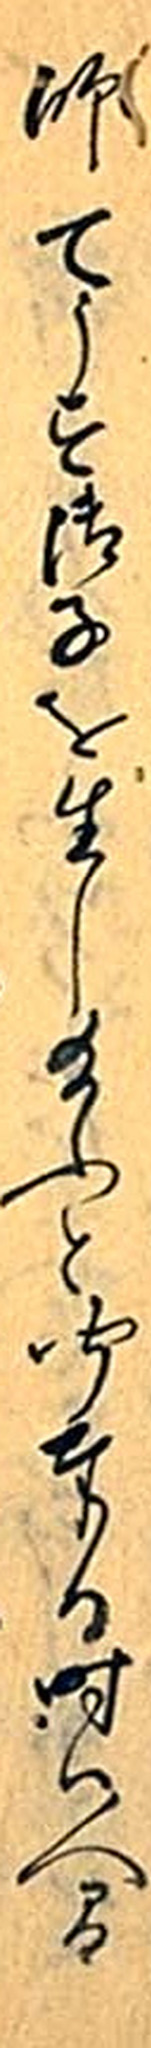師てうす御子を生し給ふと聞奉る時は人間
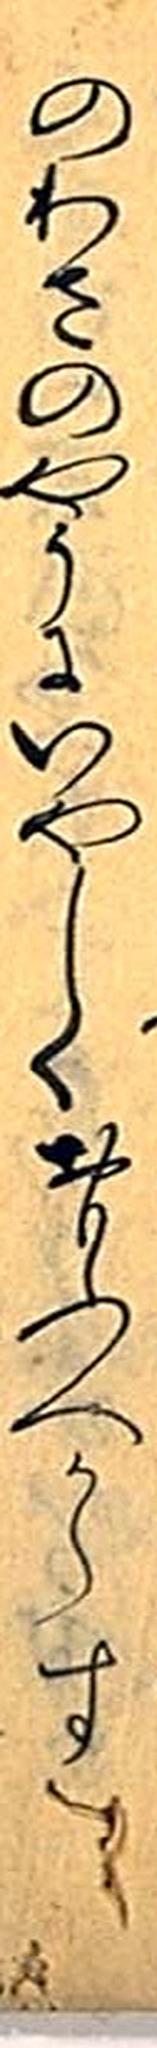のわさのやうにいやしくおもふへからす
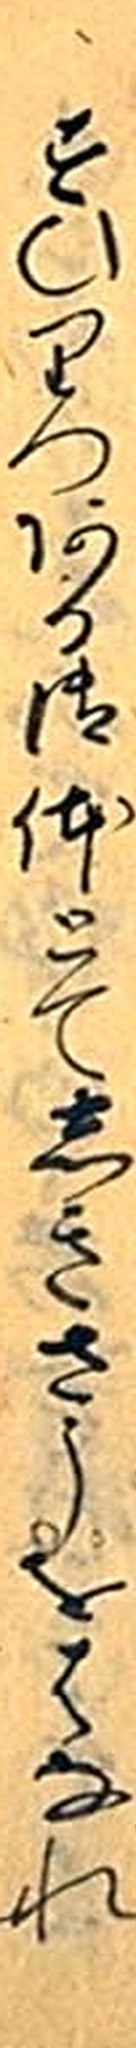すひりつある御体とてしきさうをはなれ
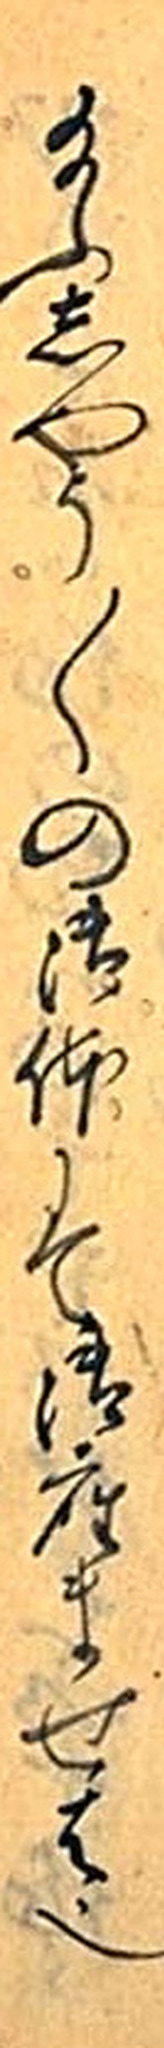給ふしやう〳〵の御体にて御座ませは也
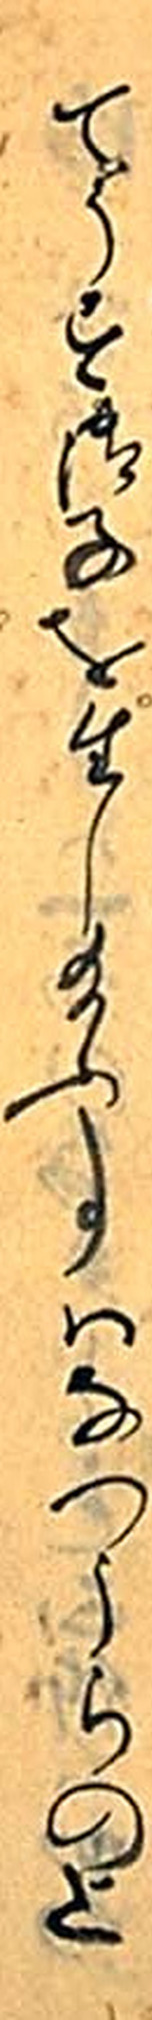てうす御子を生し給ふ事はなつうらの上
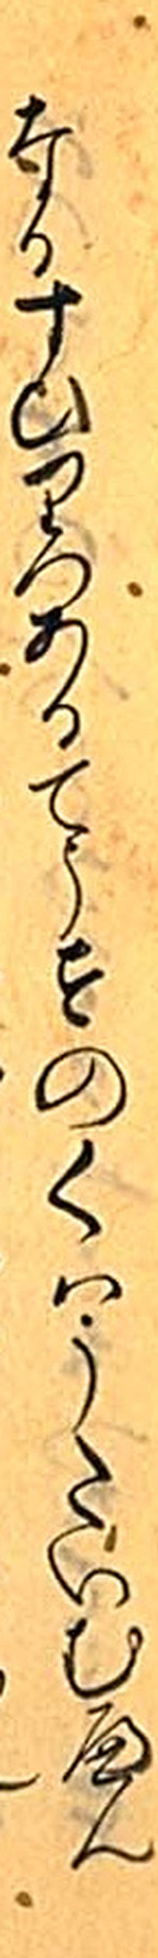なるすひりつあるてうすのくはうたいむへん
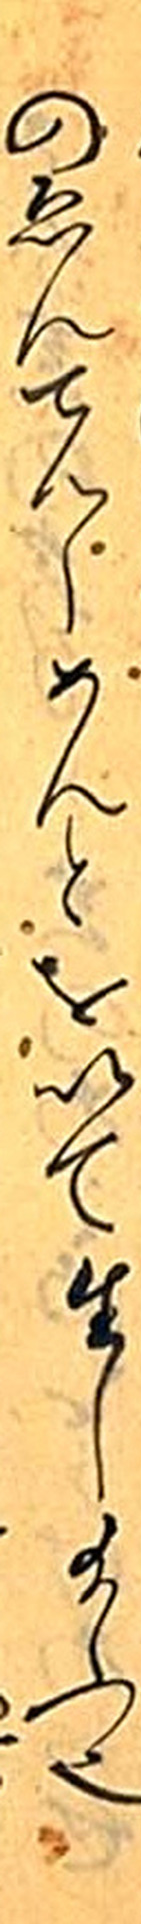のゑんてんしめんとを以て生し給ふ也
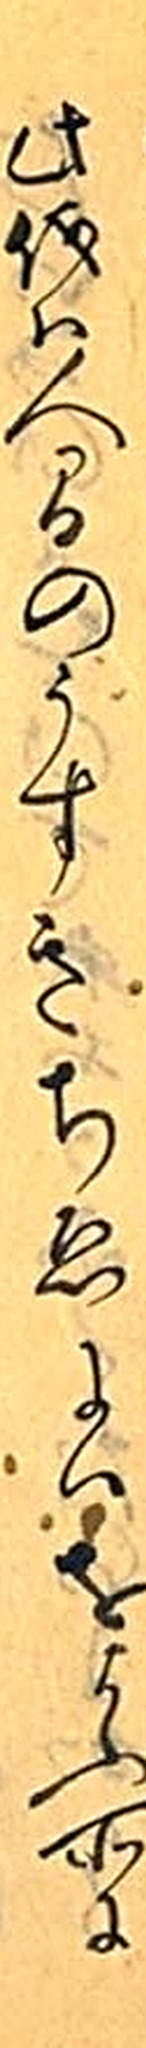此の儀は人間のうすきちゑにはをよふ所に
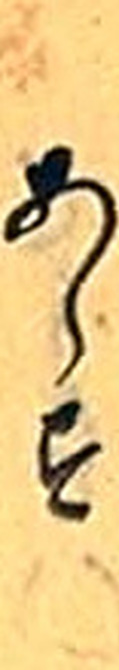あらす
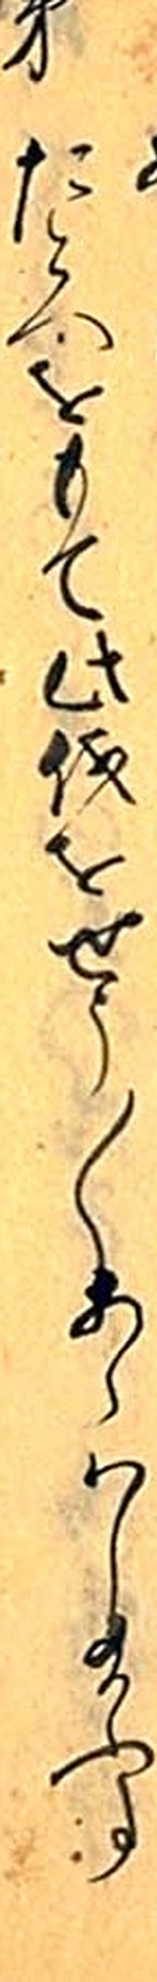弟たとへをもて此儀をせう〳〵あらはし給ふ事
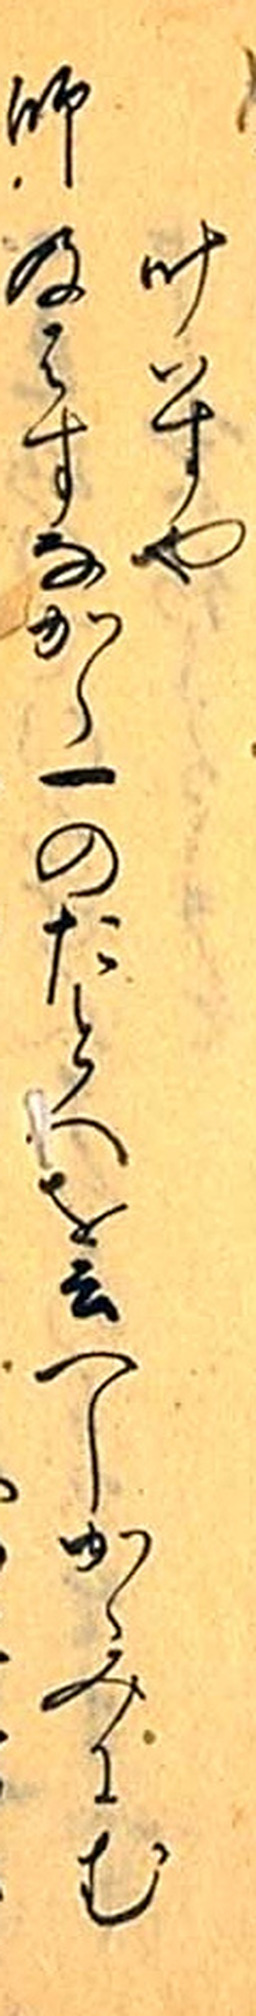師及はすなから一のたとへを云へしかゝみにむ
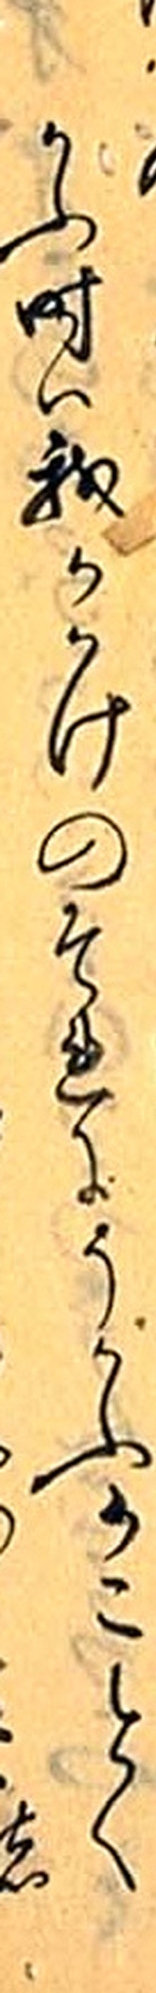かふ時は我かかけのそれにうかふかことく
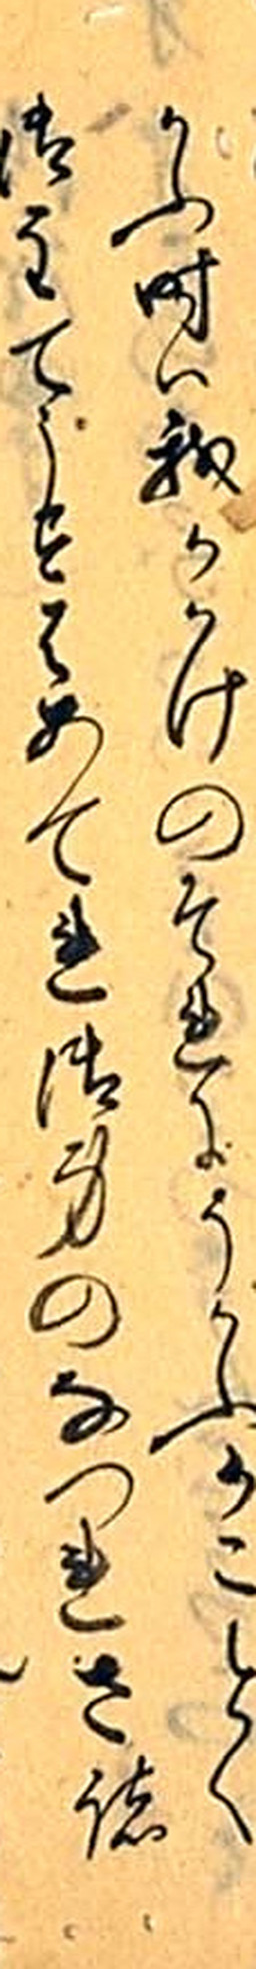御主てうすはあてれ御身のなつれさ諸
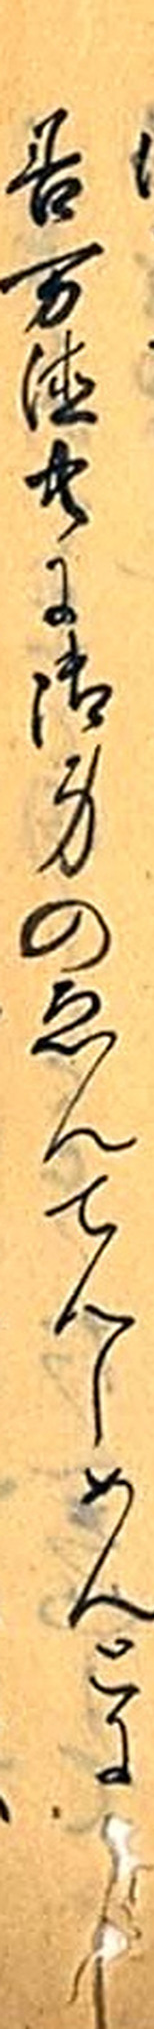善万徳共に御身のゑんてんしめんとに
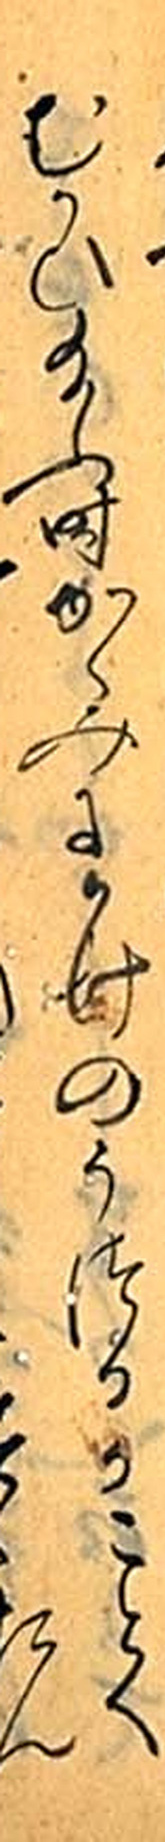むかひ給ふ時かゝみにかけのうつるかことく
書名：ドチリナ・キリシタン
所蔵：東京大学総合図書館 / General Library in the University of Tokyo
